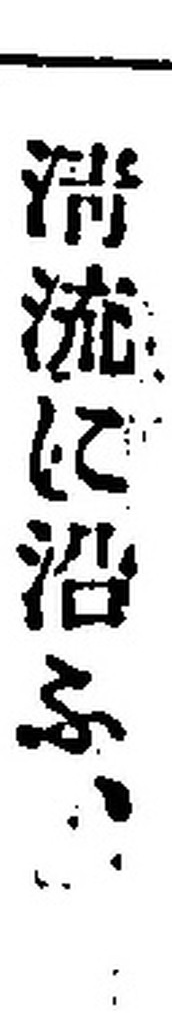清流に沿ふ、
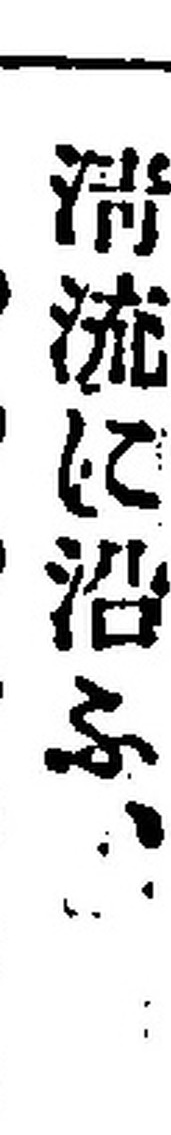清流に沿ふ、
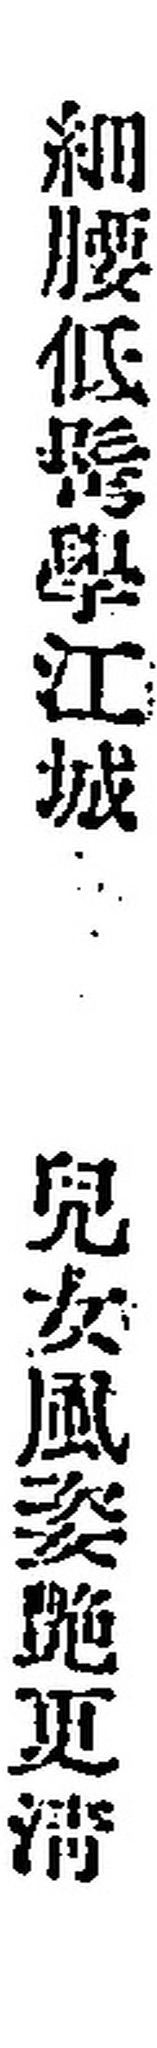細腰低髩学江城児女風姿艶更清
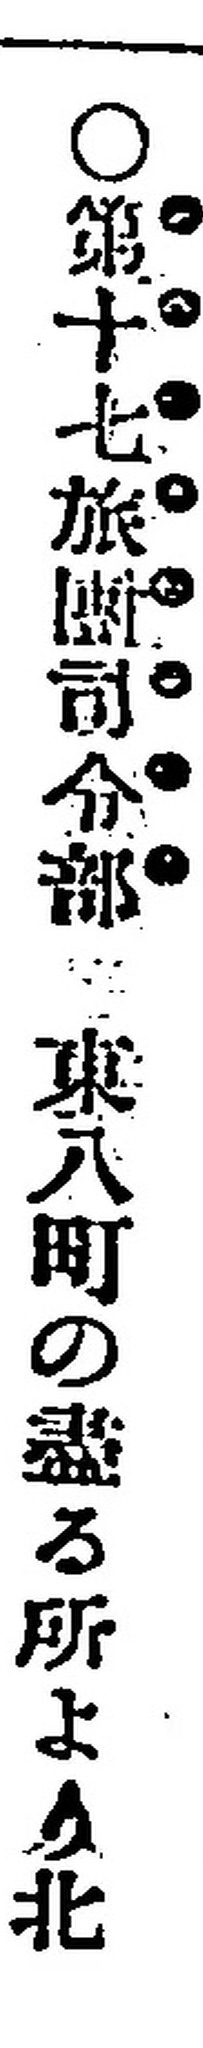○第十七旅団司令部東八町の尽る所より北
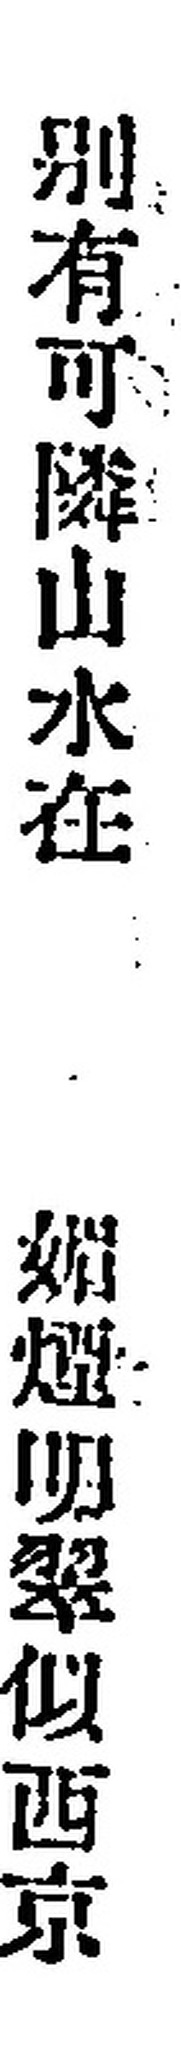別有可隣山水在媚煙明翠似西京
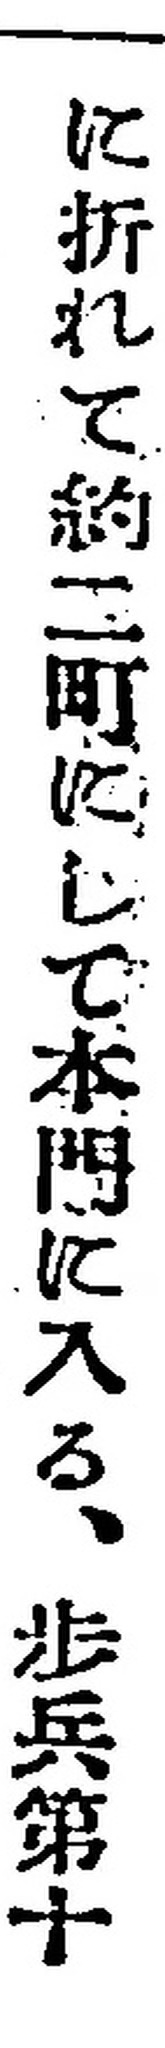に折れて約二町にして本門に入る、歩兵第十
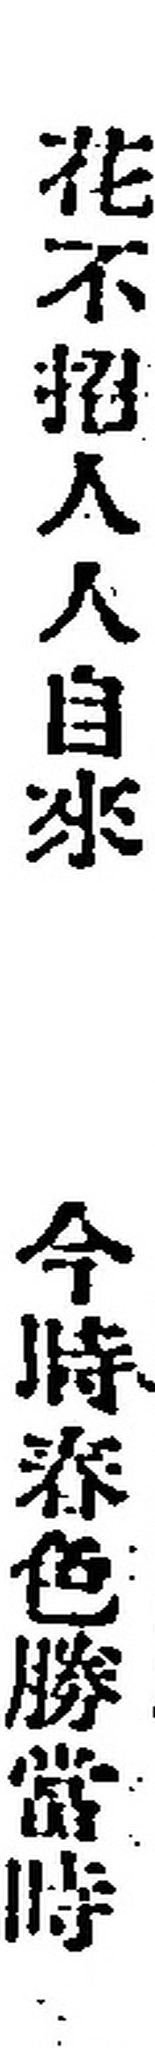花不招人人自来今時春色勝当時
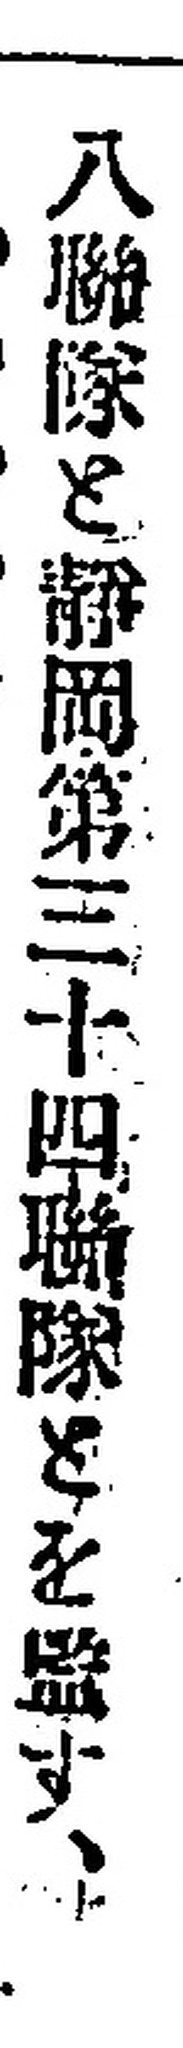八聯隊と静岡第三十四聯隊とを監す、
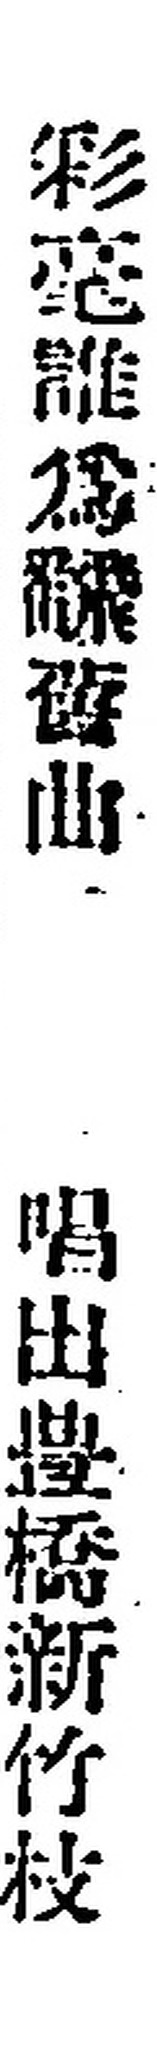彩毫誰為翻旧曲唱出豊橋新竹枝
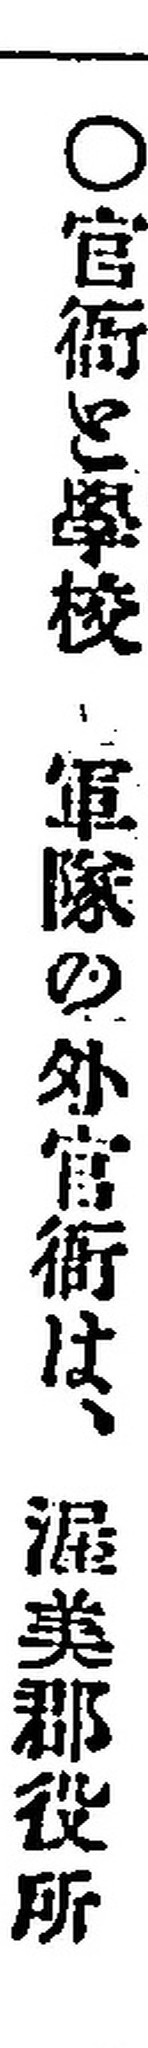○官衙と学校軍隊の外官衙は、渥美郡役所
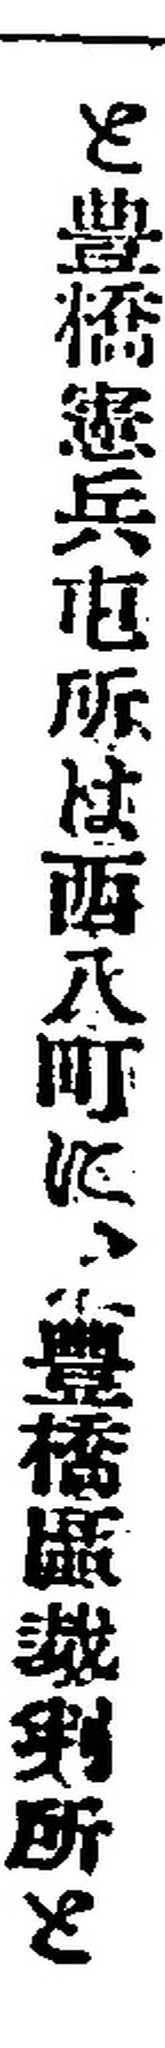と豊橋憲兵屯所は西八町に、豊橋区裁判所と
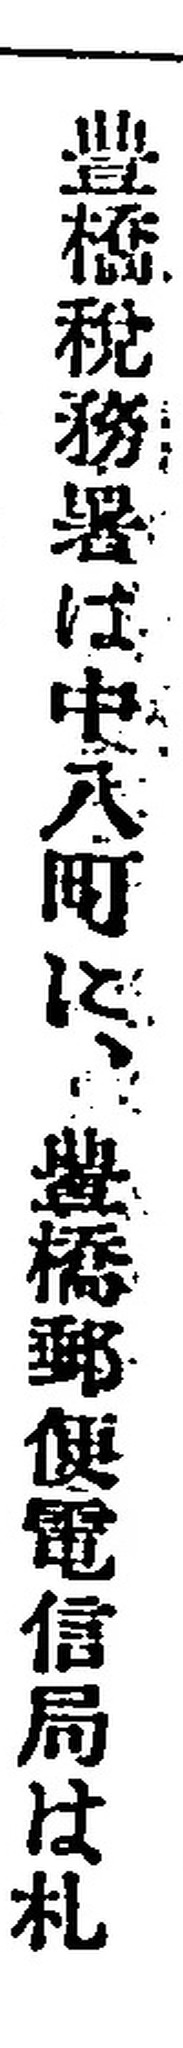豊橋税務署は中八町に、豊橋郵便電信局は札
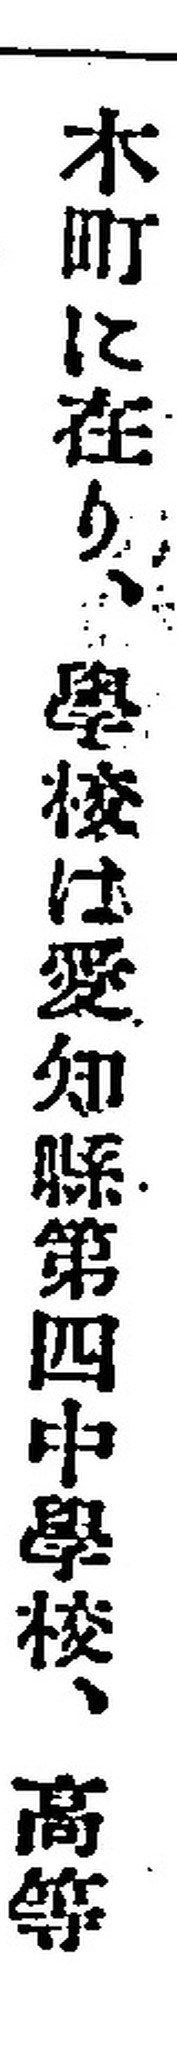木町に在り、学校は愛知県第四中学校、高等
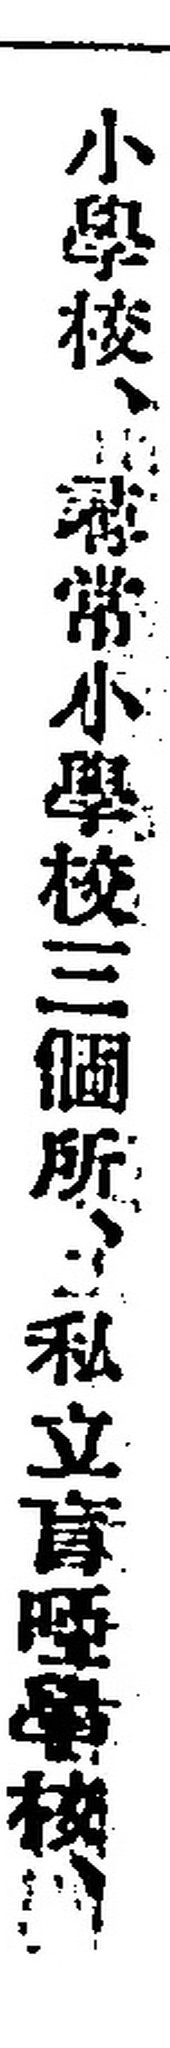小学校、尋常小学校三個所、私立盲唖学校、
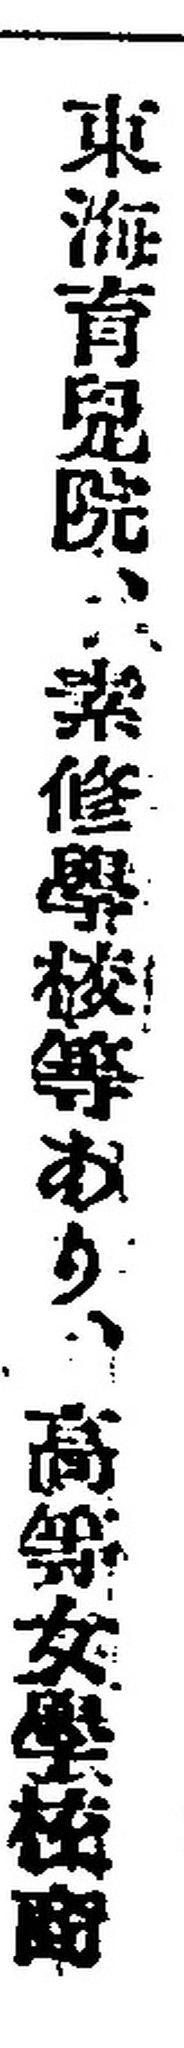東海育児院、素修学校等あり、高等女学校商
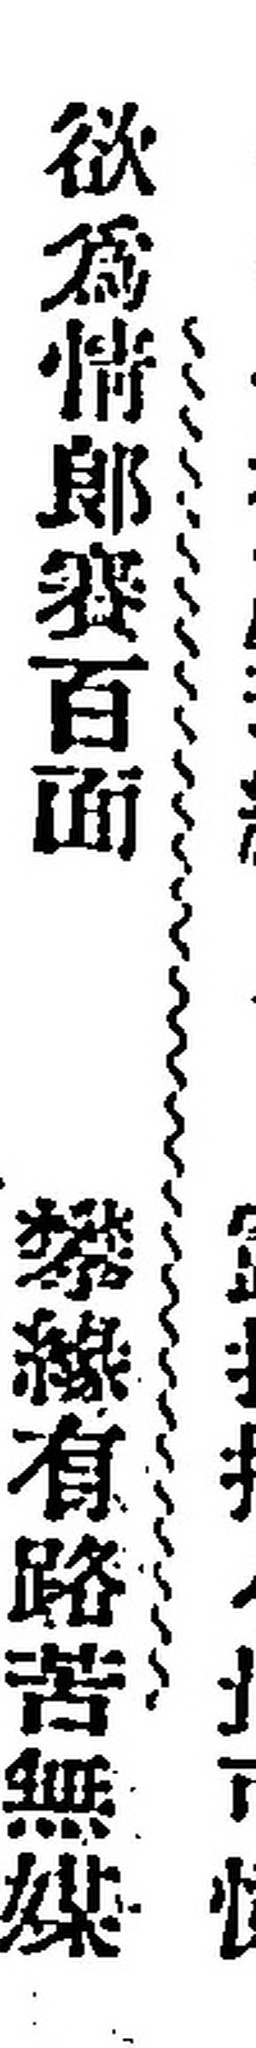欲為情郎賽百面攀縁有路苦無媒
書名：東参名勝案内
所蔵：国立国会図書館 National Diet Library, JAPAN
